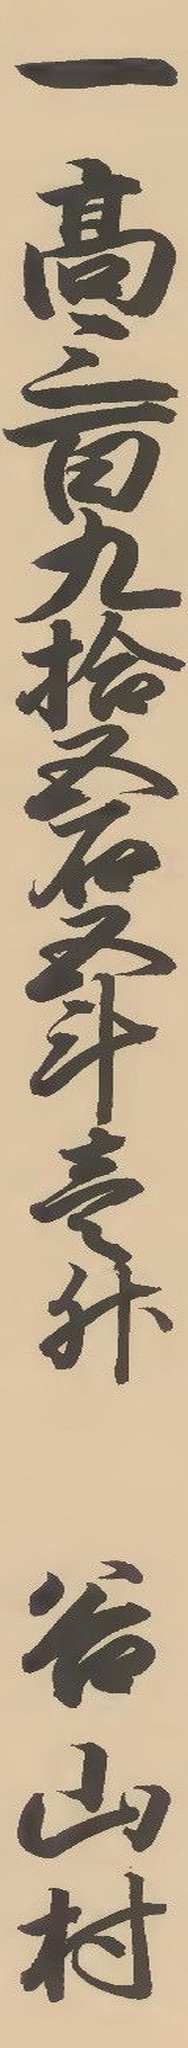一高三百九拾五石五斗壱升谷山村
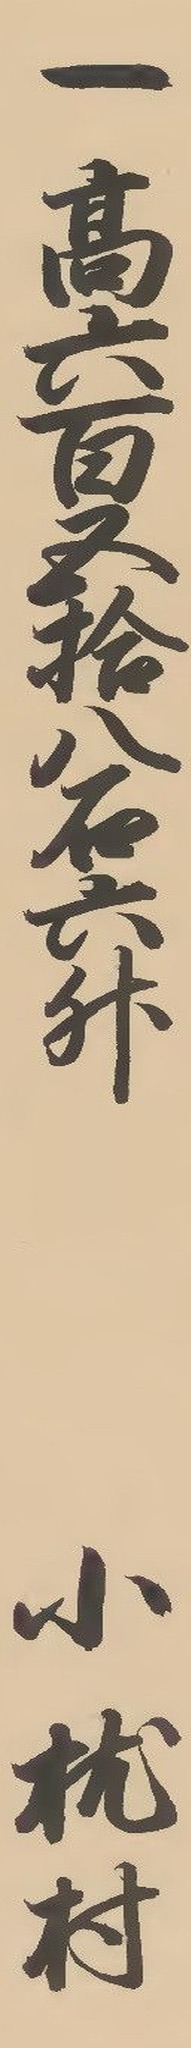一高六百五拾八石六升小枕村
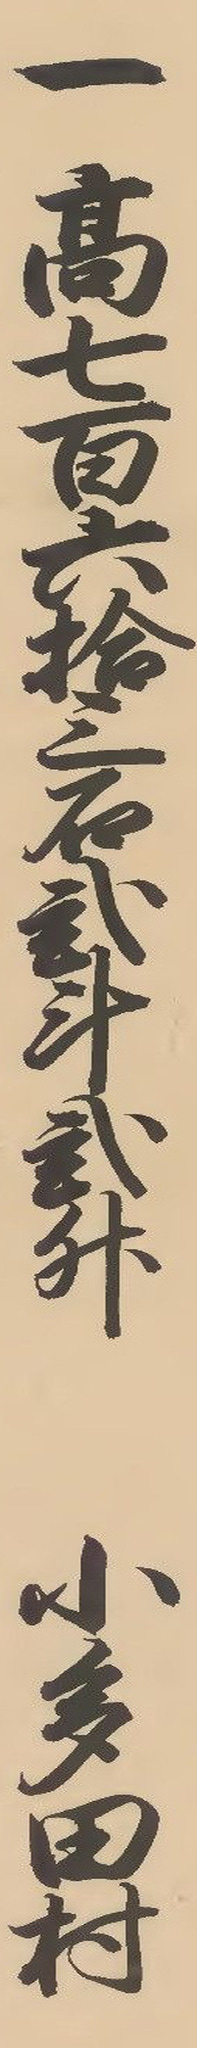一高七百六拾三石弐斗弐升小多田村
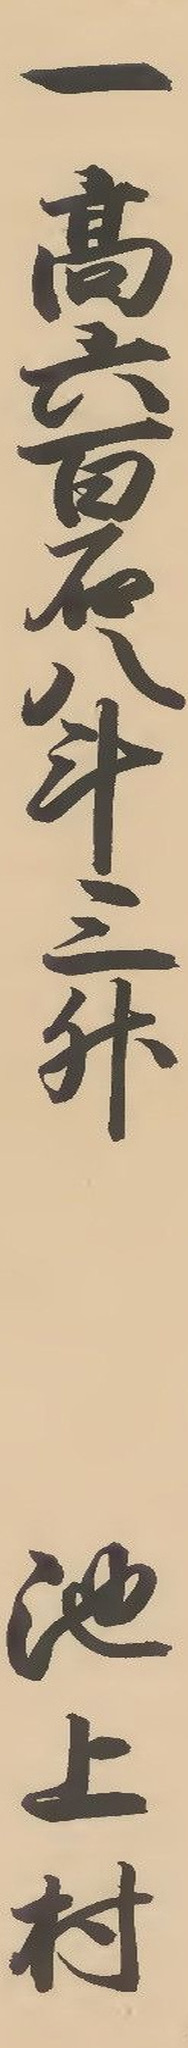一高六百石八斗三升池上村
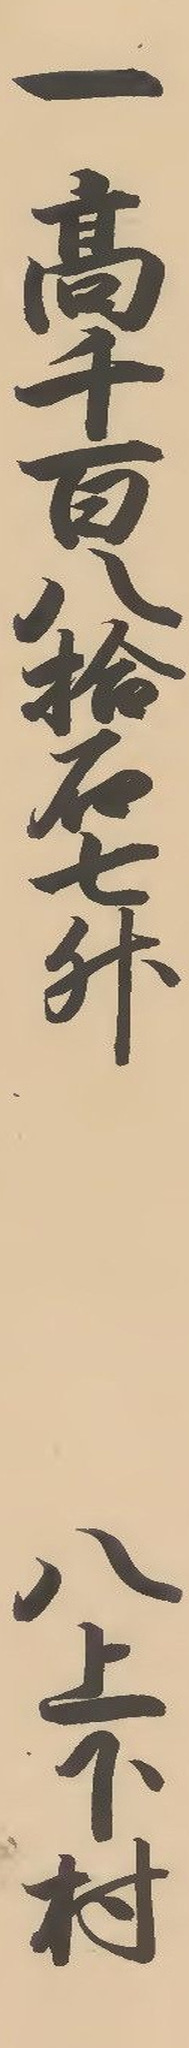一高千百八拾石七升八上下村
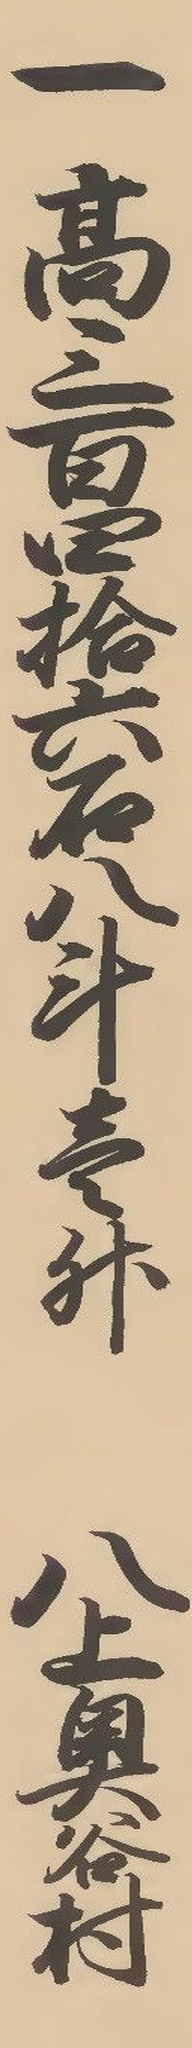一高三百四拾六石八斗壱升八上奥谷村

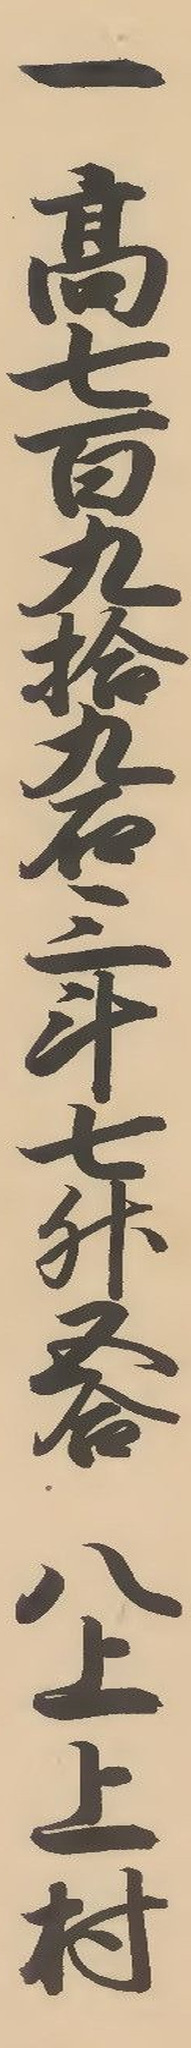一高七百九拾九石三斗七升五合八上上村
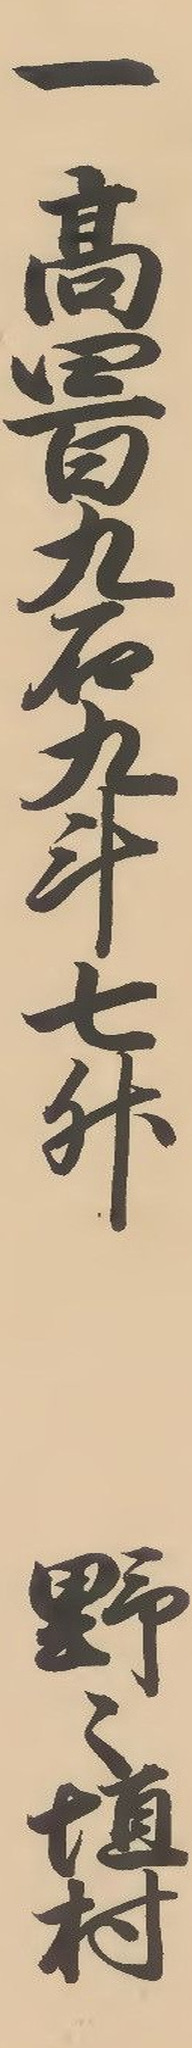一高四百九石九斗七升野々垣村
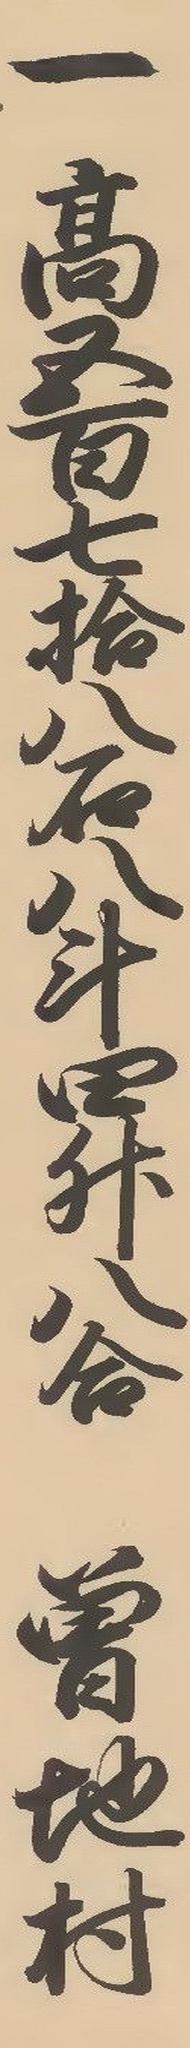一高五百七拾八石八斗四升八合曽地村
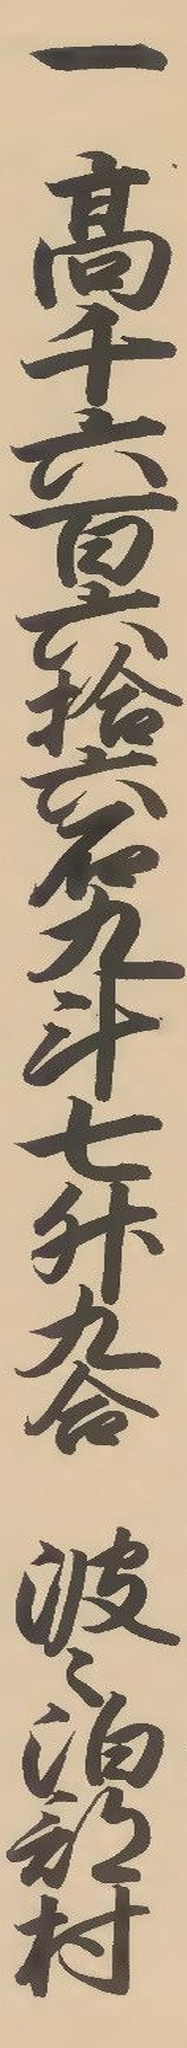一高千六百六拾六石九斗七升九合波々泊部村
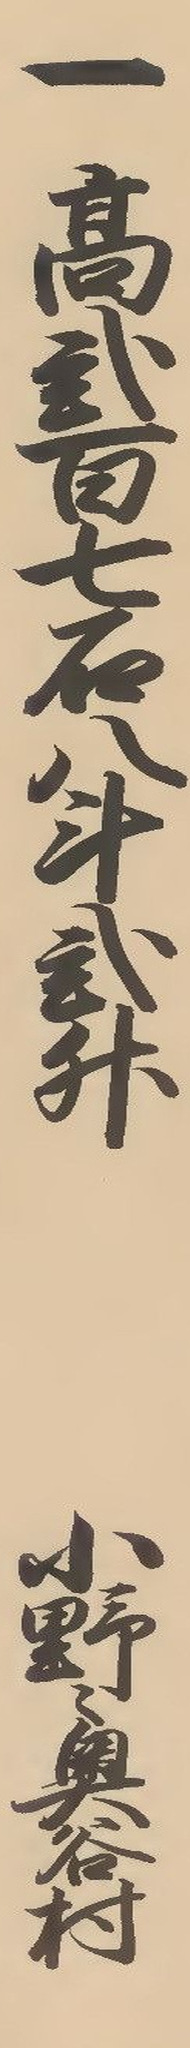一高弐百七石八斗弐升小野々奥谷村
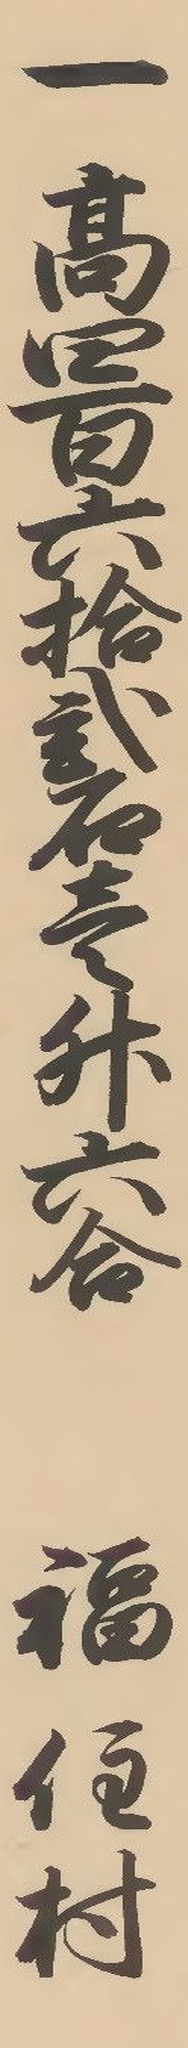一高四百六拾弐石壱升六合福住村

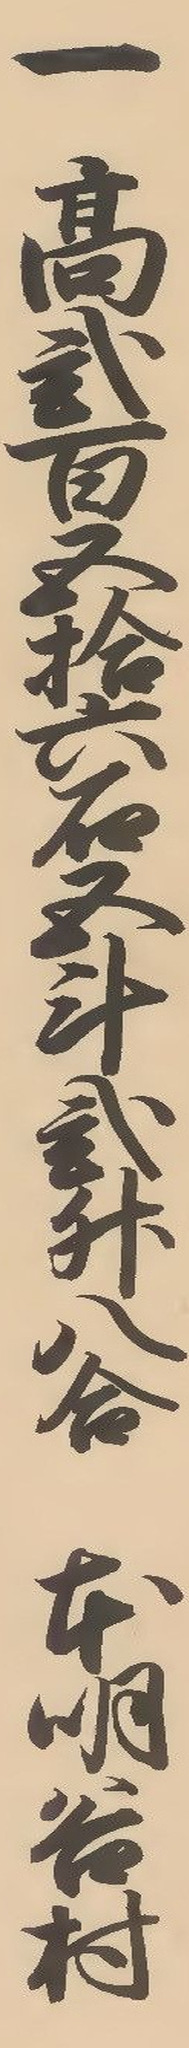一高弐百五拾六石五斗弐升八合本明谷村
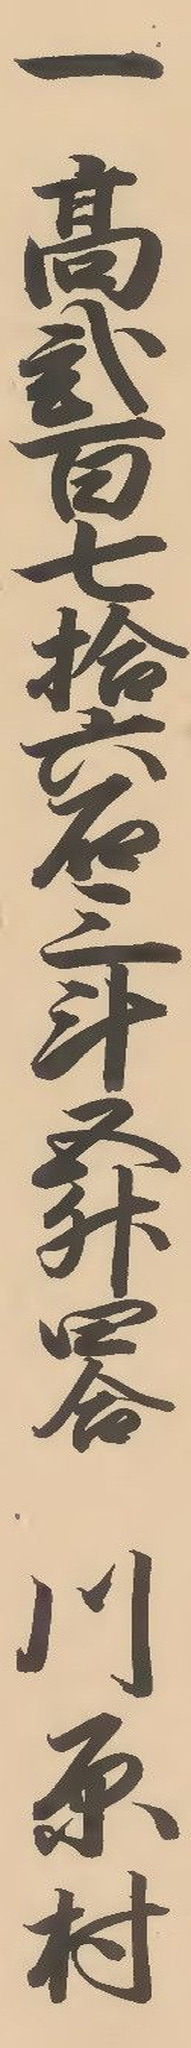一高弐百七拾六石三斗五升四合川原村
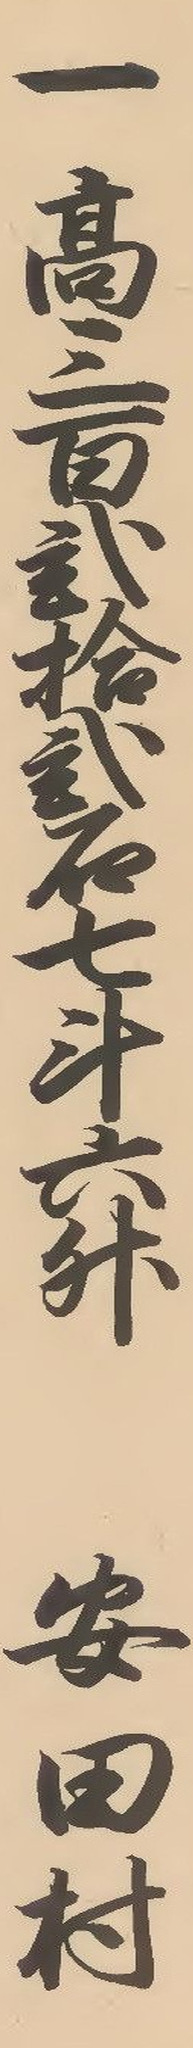一高三百弐拾弐石七斗六升安田村
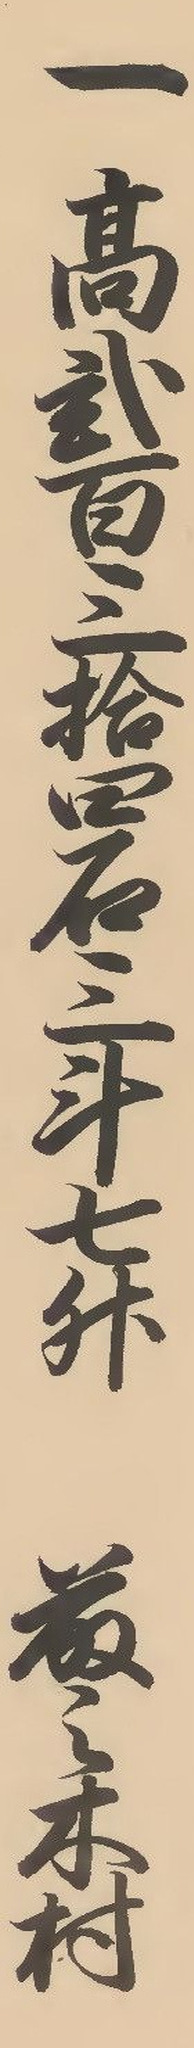一高弐百三拾四石三斗七升藤之木村
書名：丹波国郷帳
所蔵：国立公文書館 National Archives of Japan
